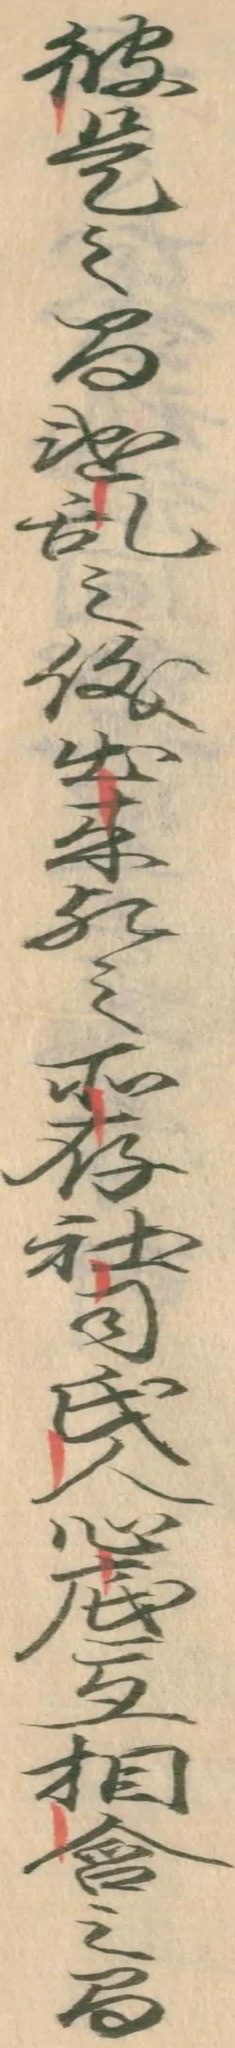彼_是之間違-乱之儀出-来歟之所-存社-司氏心-底互相_含之間
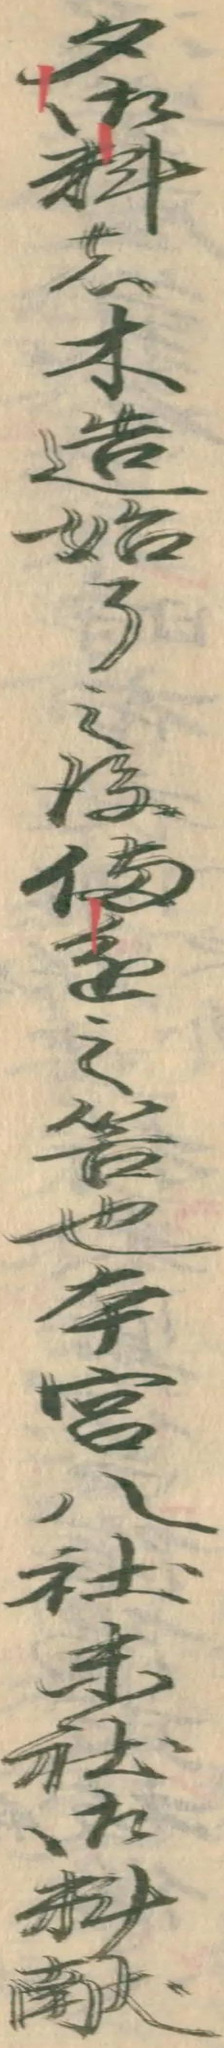夕_御-料者木造始了之後備-進之筈也本宮八社末社御料献
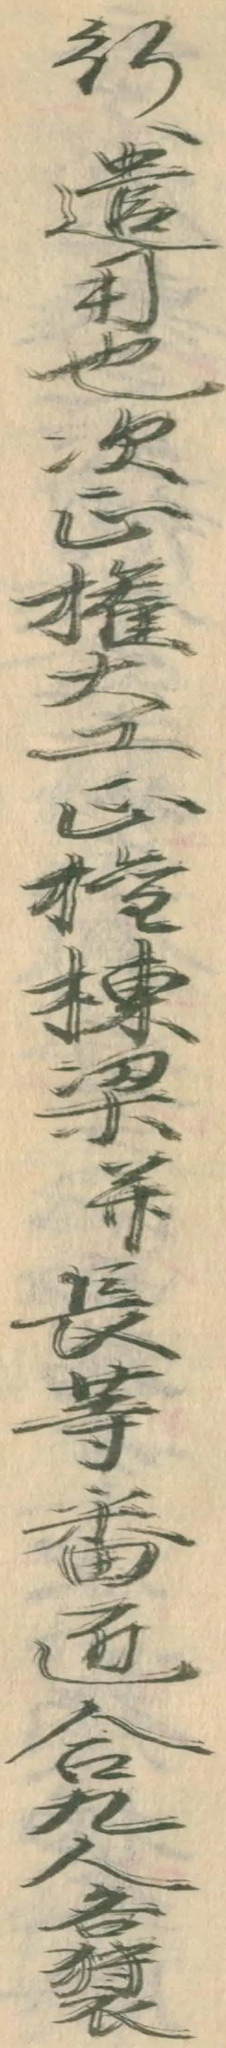行ヘ遣用也次正権大工正権棟梁并長等番匠合九人各狩衣

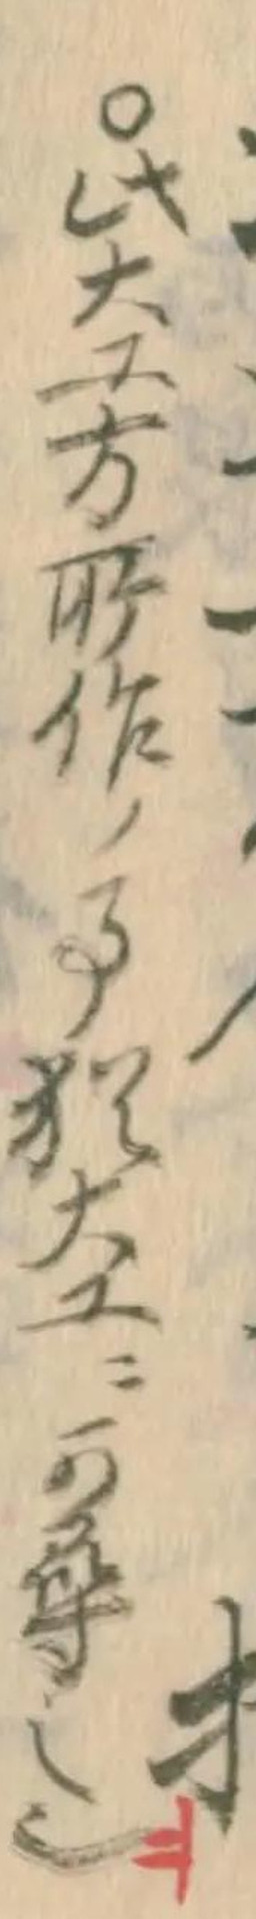￮此大工方所作ノ事猶大工ニ可尋之也
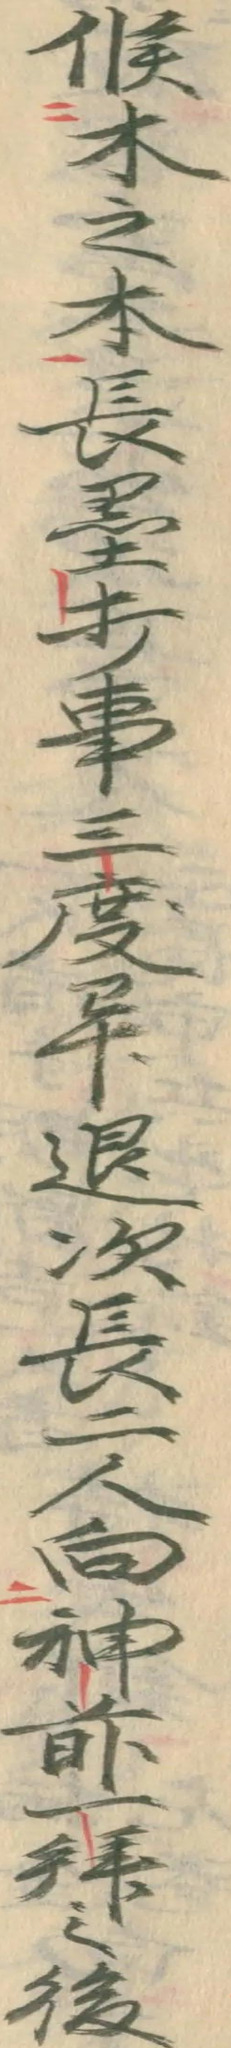候木之本長墨_打事三-度畢退次長二人向神-前一-拝之後

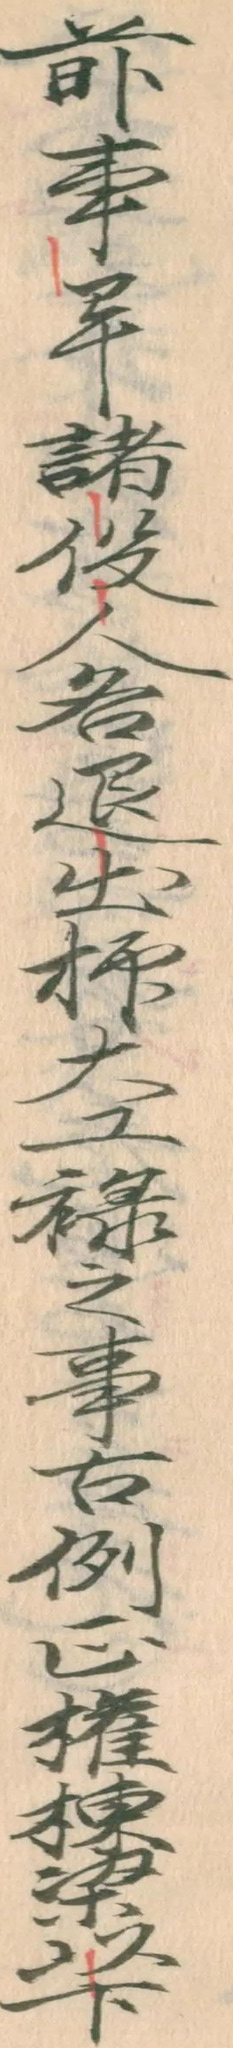前事_畢諸-役-人各退-出柳大工禄之事古例正権棟梁以-下

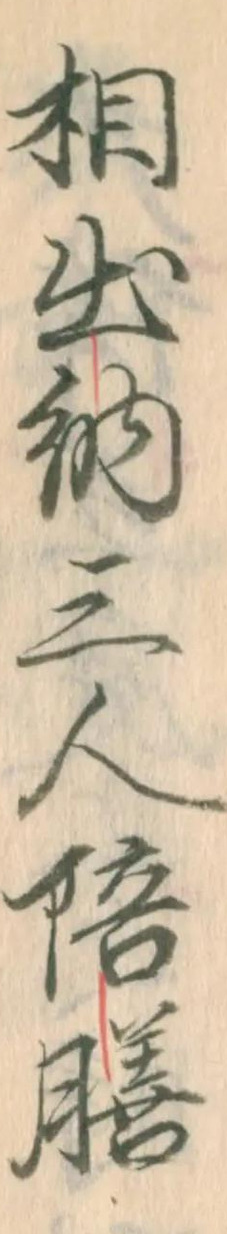相出-納三人陪-膳
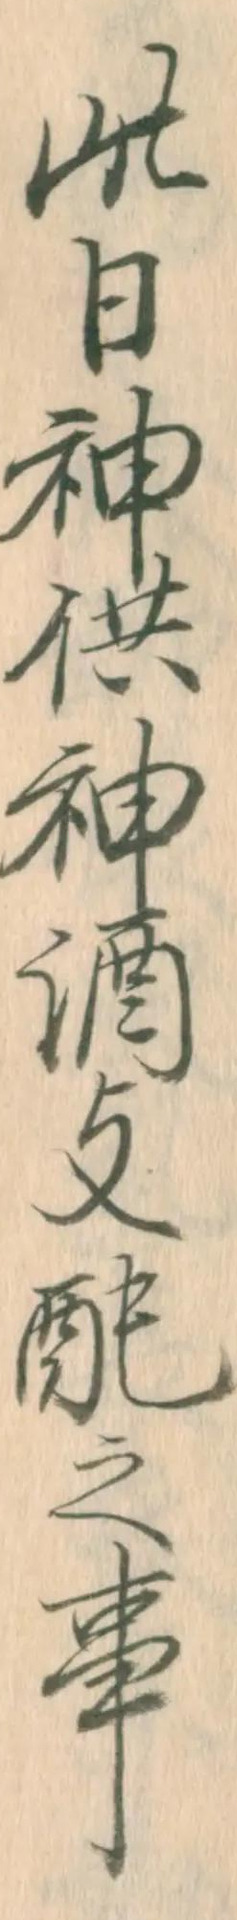此日神供神酒支配之事
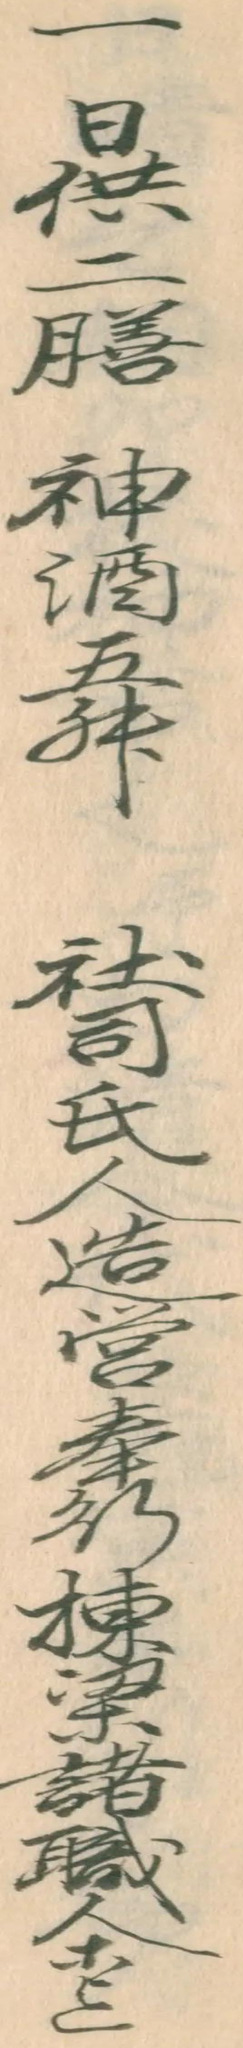一日供二膳神酒五升社司氏人造営奉行棟梁諸職人等迄
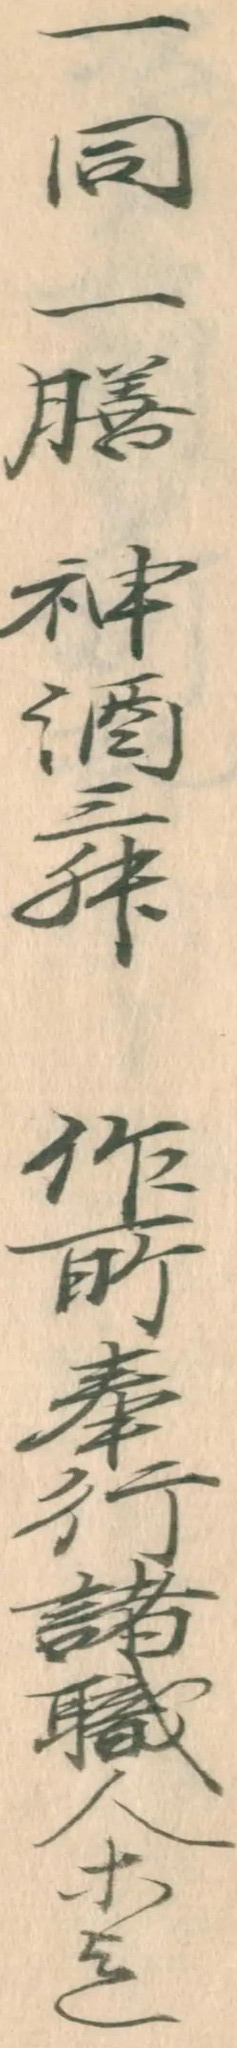一同一膳神酒三升作所奉行諸職人等迄
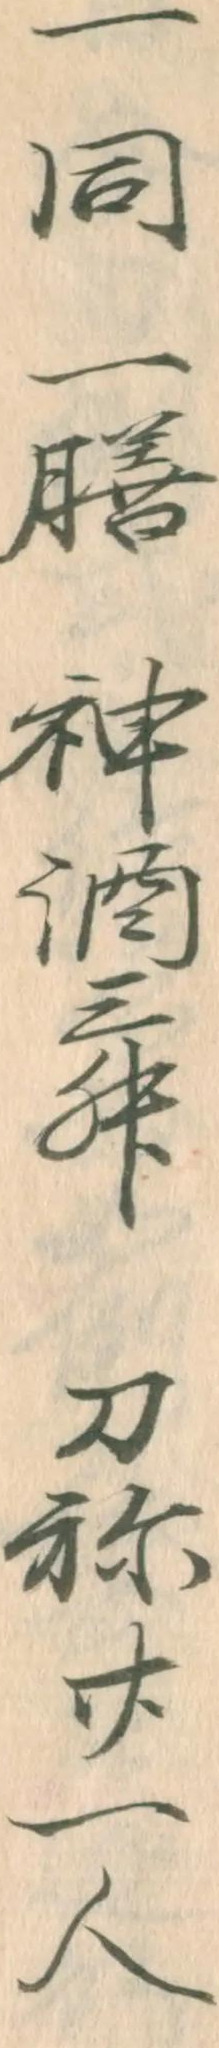一同一膳神酒三升刀祢廿一人
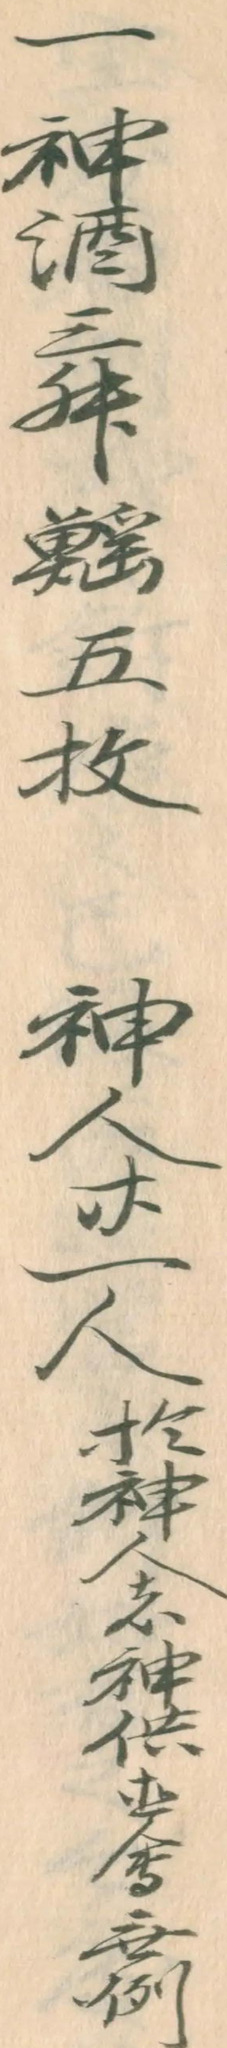一神酒三升鰩五枚神人廿一人於神人者神供直会無例

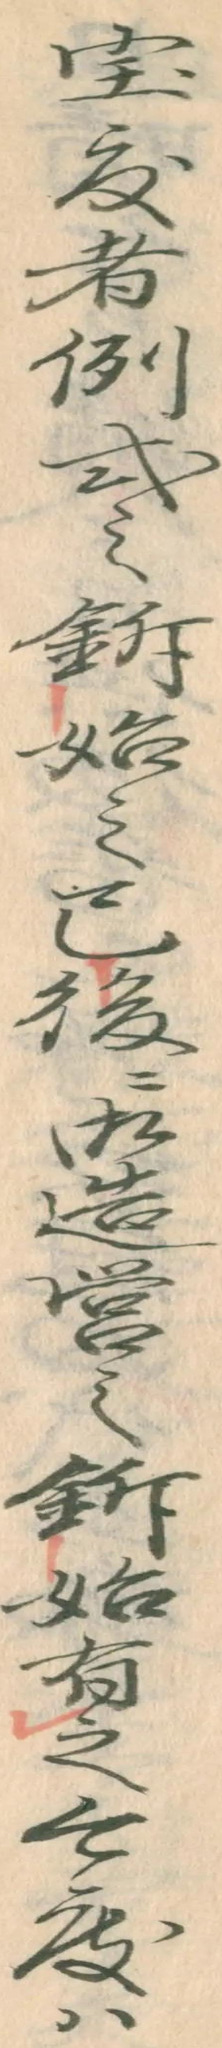宝度者例式之釿_始之已-後ニ御造営之釿_始有之今度ハ
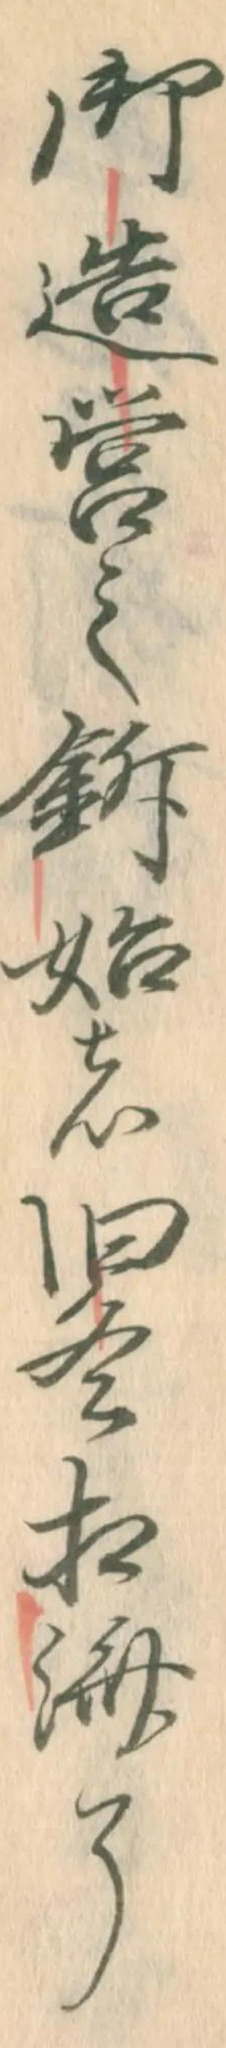御-造-営之釿_始者旧冬相_済了
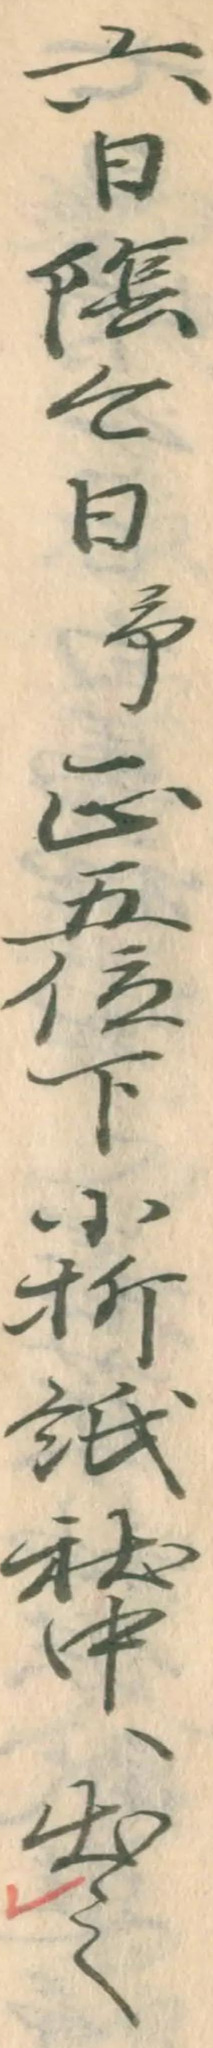六日陰今日予正五位下小折紙社中へ出之

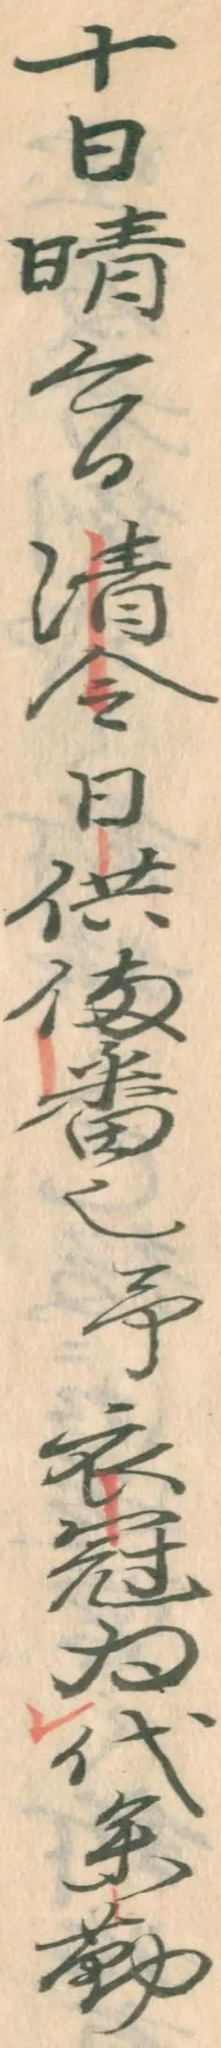十日晴今日清令日-供備_番也予衣-冠為代参-勤
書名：賀茂社記録. 第15冊
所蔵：国立国会図書館 National Diet Library, JAPAN
